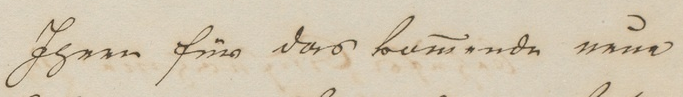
Ihnen für das kommende neue
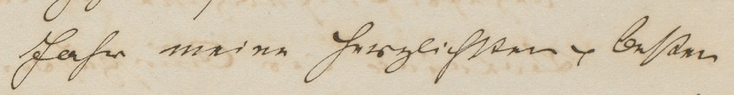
Jahr meine herzlichsten & besten
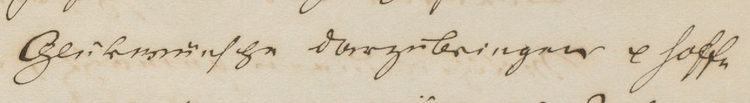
Glükwünsche darzubringen & hoffe
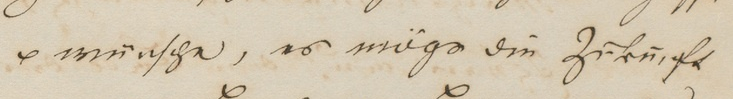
& wünsche, es möge die Zukunft
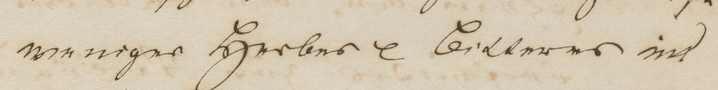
weniger Herbes & Bitteres imn
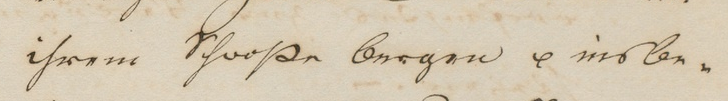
ihrem Schooße bergen & insbe-
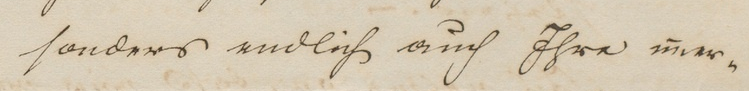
sonders endlich auch Ihre uner-
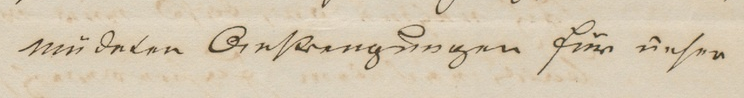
müdeten Anstrengungen für unser
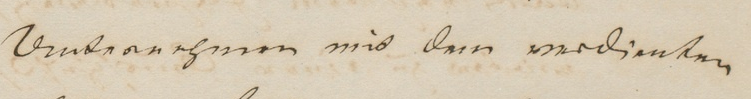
Unternehmen mit dem verdienten
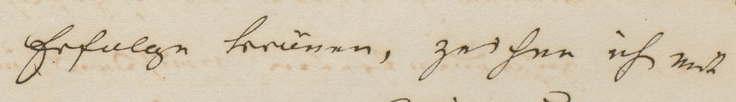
Erfolge krönen, zeichne ich mit
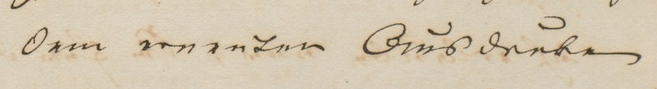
dem erneuten Ausdruke
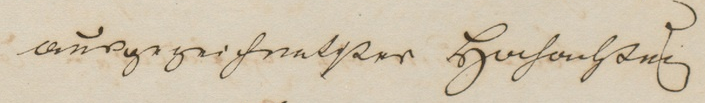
ausgezeichnetster Hochachtung
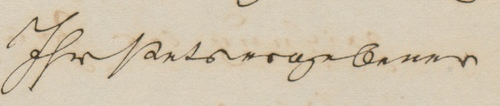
Ihr stets ergebener
